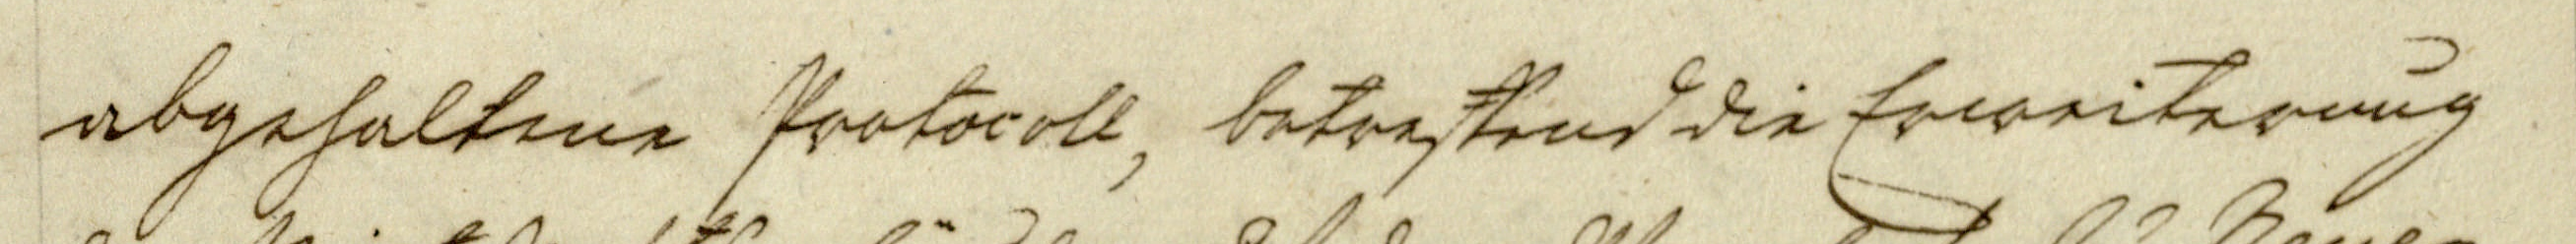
abgehaltene Protocoll, betreffend die Erweiterung
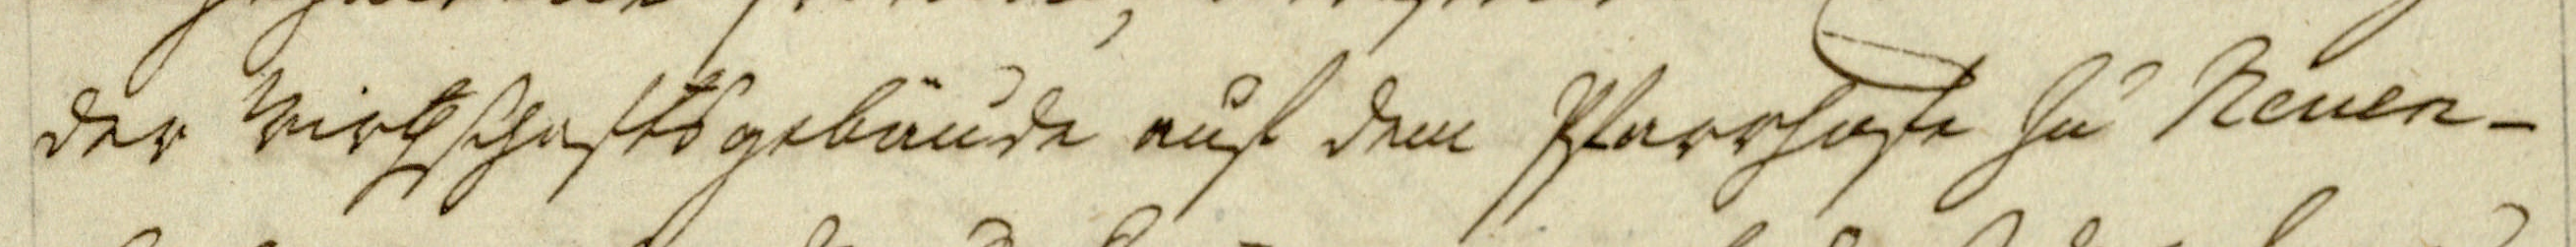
der Wirthschaftsgebäude auf dem Pfarrhofe zu Neuen¬
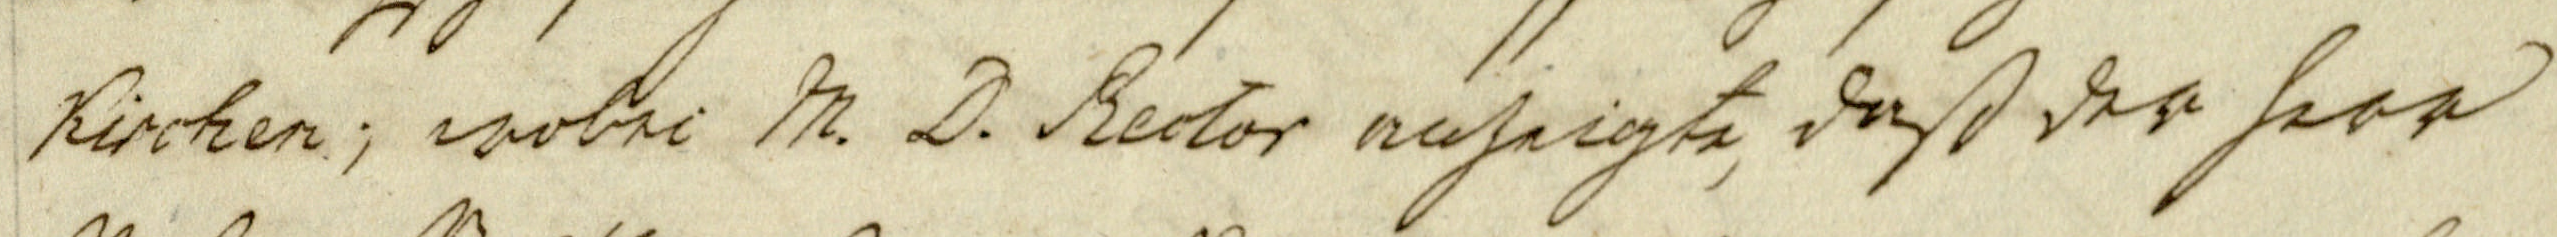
kirchen; wobei M. D. Rector anzeigte, daß der herr
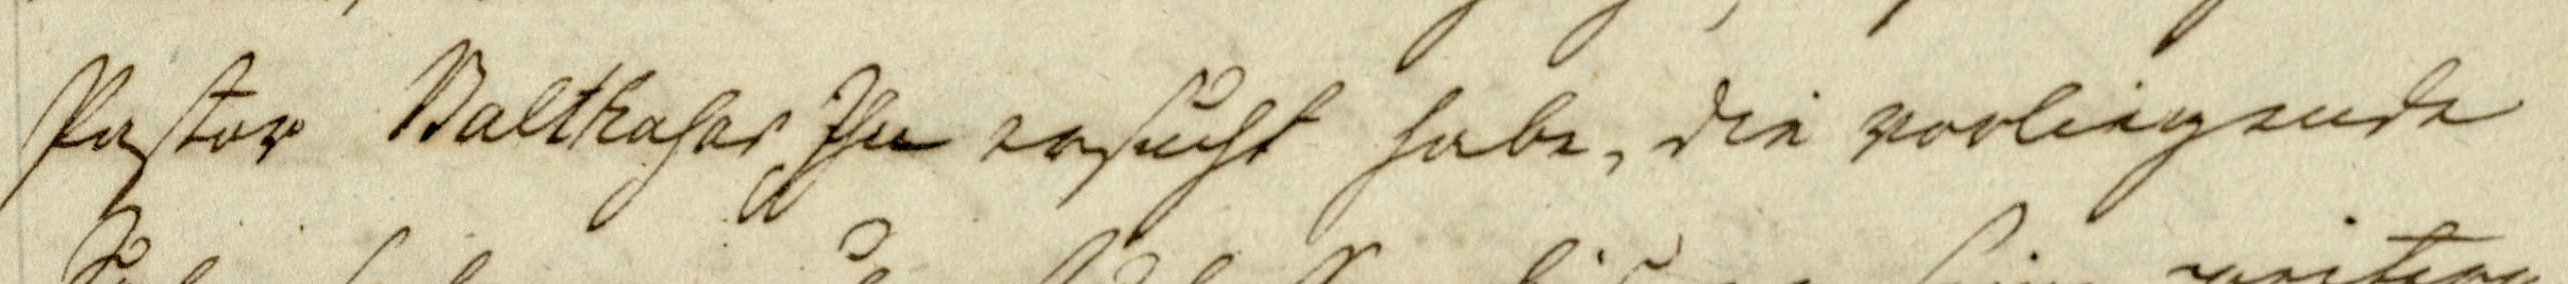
Pastor Balthasar Ihn ersucht habe, die vorliegende
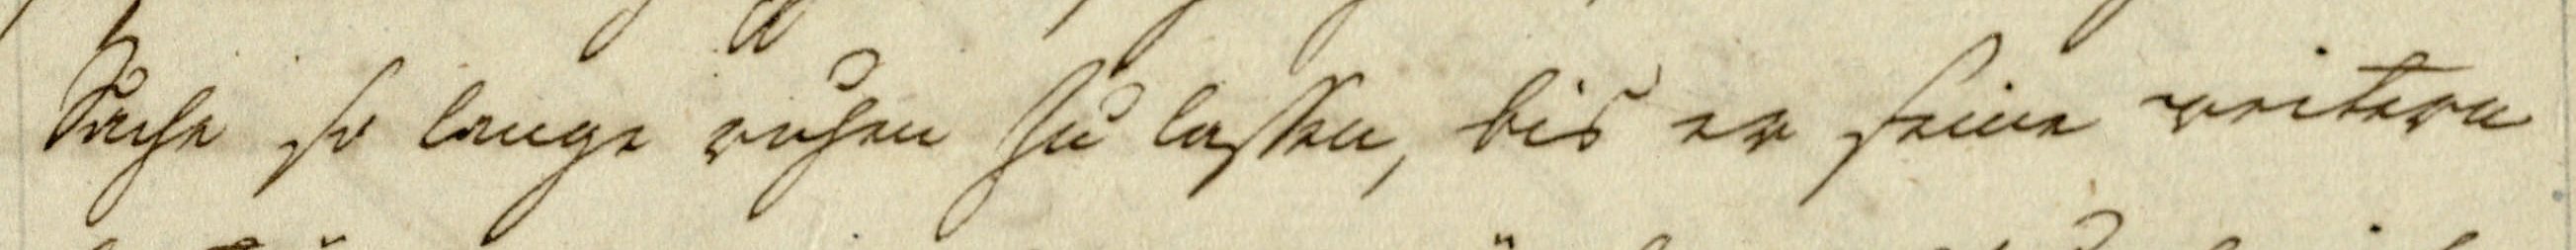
Sache so lange ruhen zu lassen, bis er seine weitern
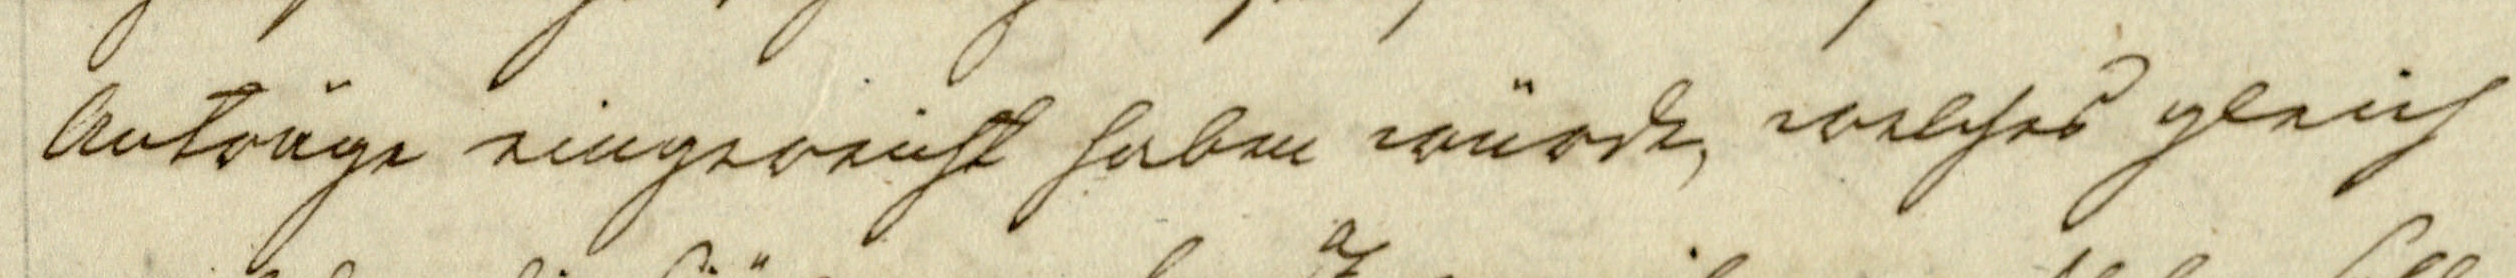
Anträge eingereicht haben würde, welches gleich
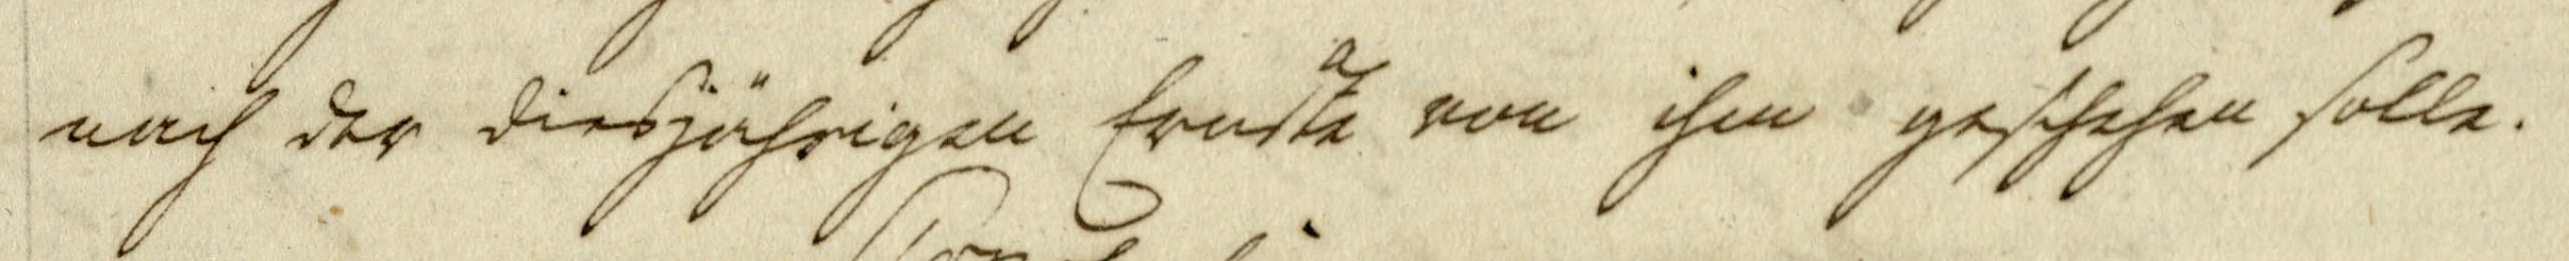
nach der diesjährigen Ernte von ihm geschehen solle.
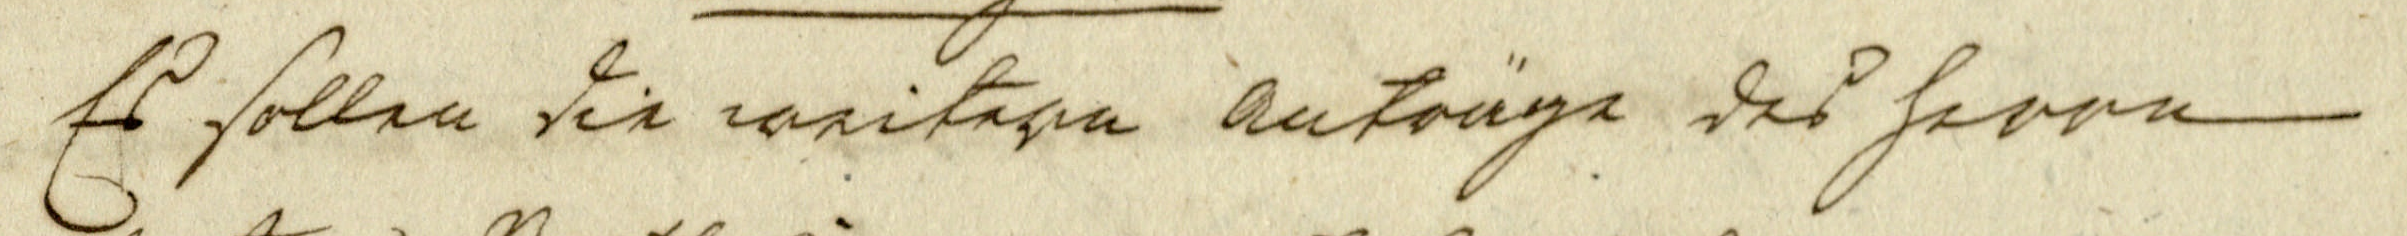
Es sollen die weiteren Anträge des herrn
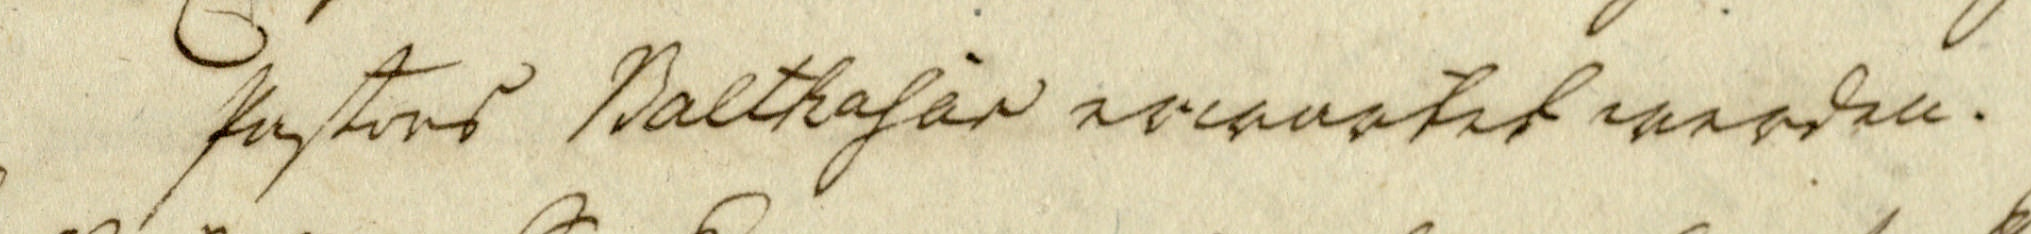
Pastors Balthasar erwartet werden.
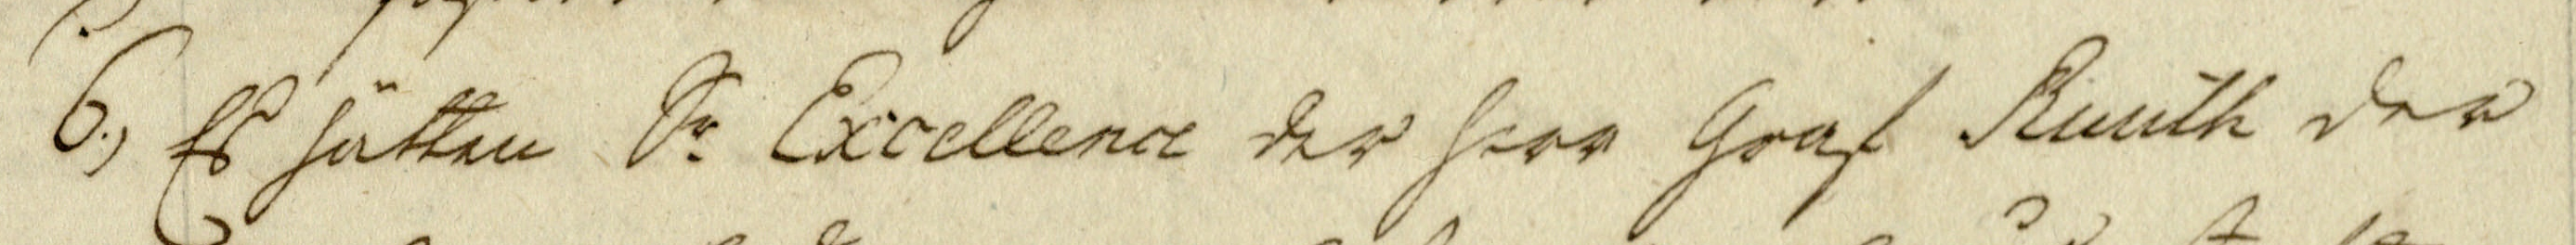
6., Es hätten Sr. Excellence der herr Graf Ruuth der
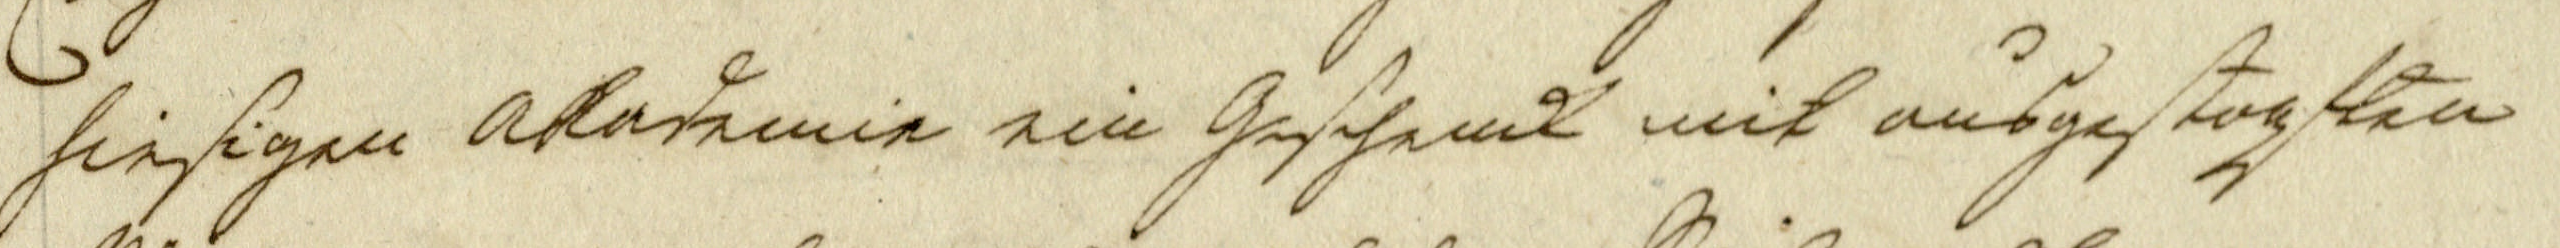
hiesigen Akademie ein Geschenck mit ausgestopften
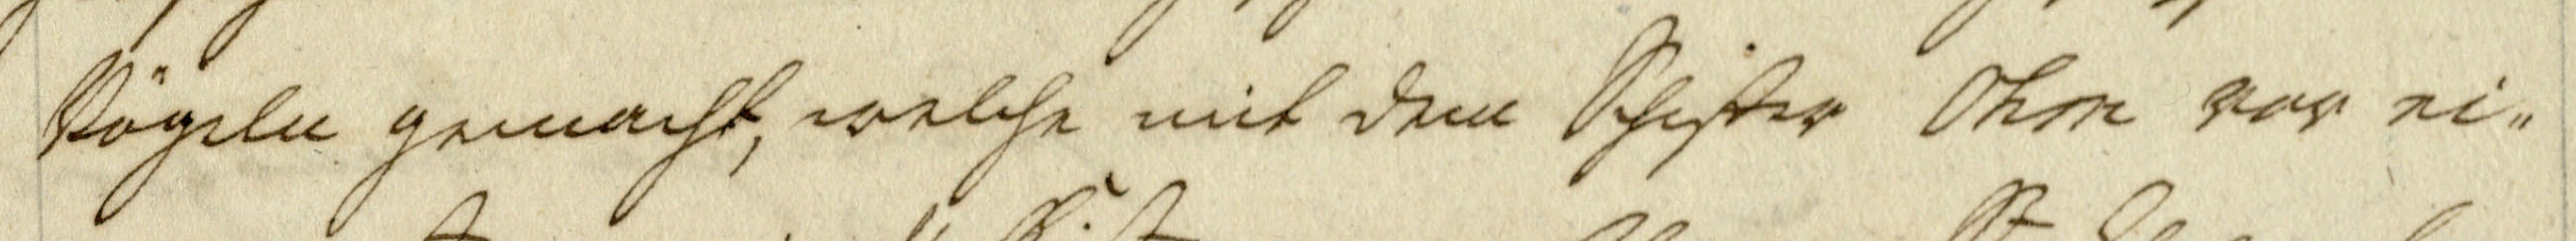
Vögeln gemacht, welche mit dem Schifer Ohm vor ei¬
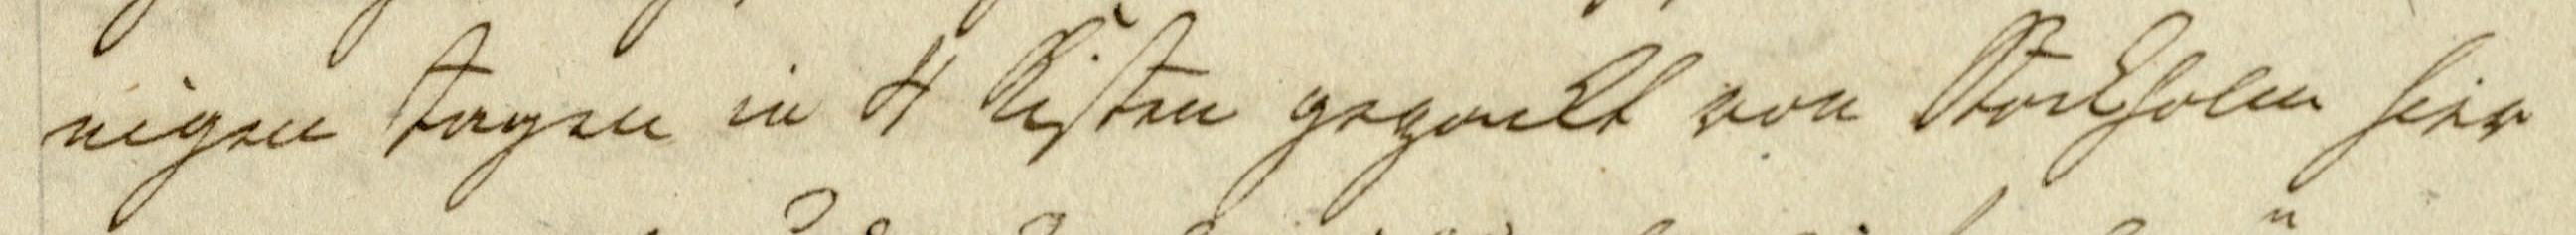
nigen Tagen in 4 Kisten gepackt von Stockholm hier
